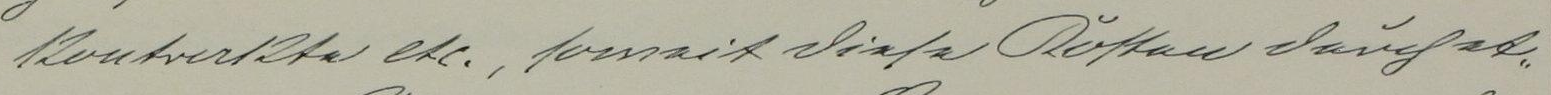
kontrakte etc., soweit diese Kosten durch et-
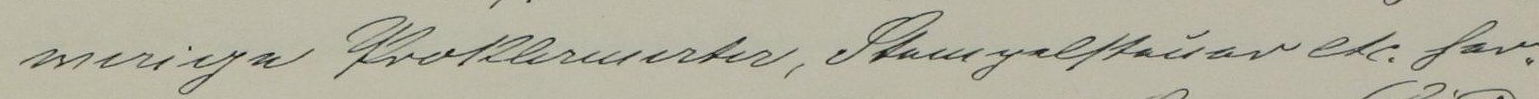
waige Proklamata, Stempelsteuer etc. her-
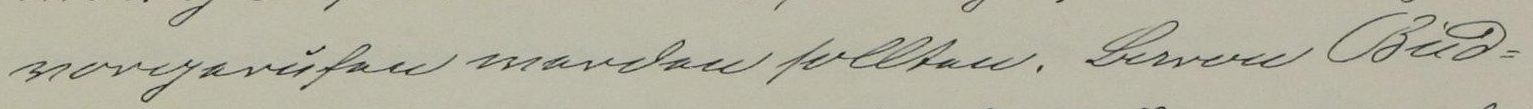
vorgerufen werden sollten. Baron Bud-
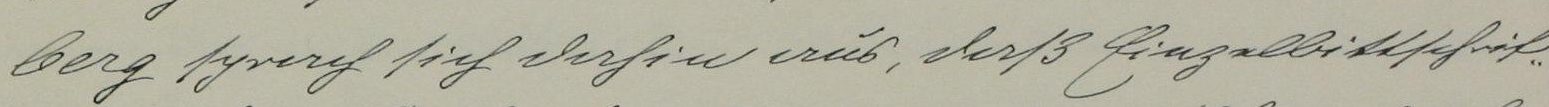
berg sprach sich dahin aus, daß Einzelbittschrif-
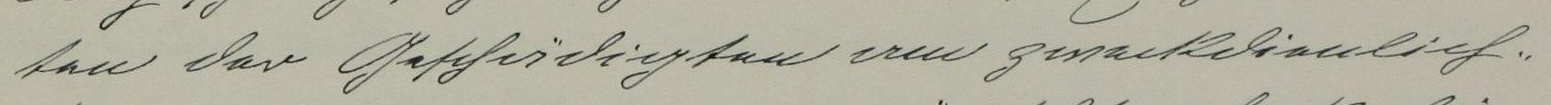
ten der Geschädigten am zweckdienlich-
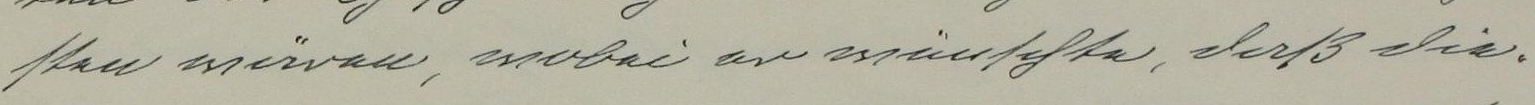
sten wären, wobei er wünschte, daß die-
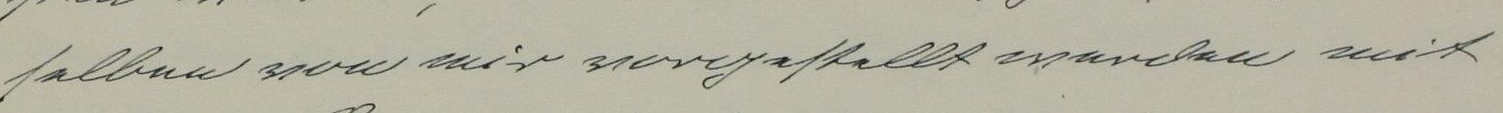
selben von mir vorgestellt werden mit
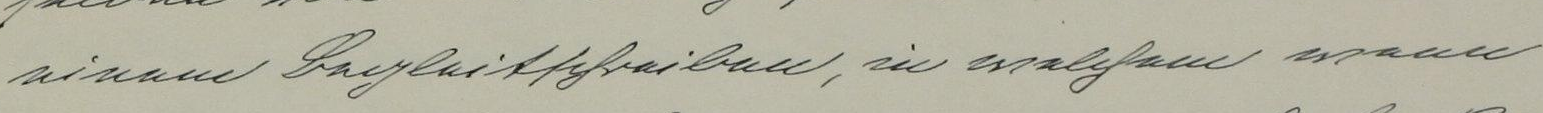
einem Begleitschreiben, in welchem wenn
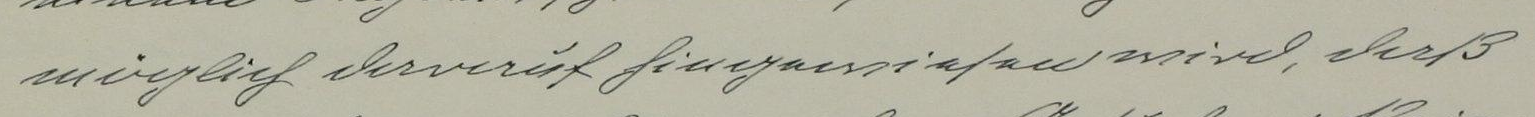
möglich darauf hingewiesen wird, daß
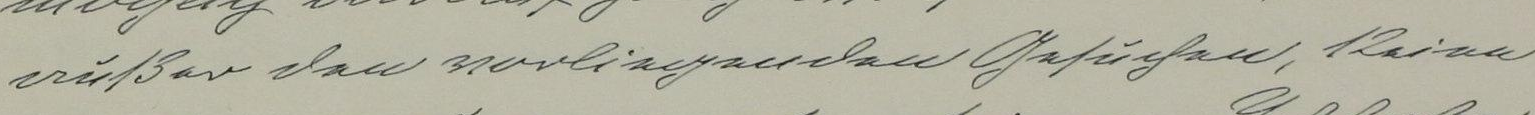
außer den vorliegenden Gesuchen, keine
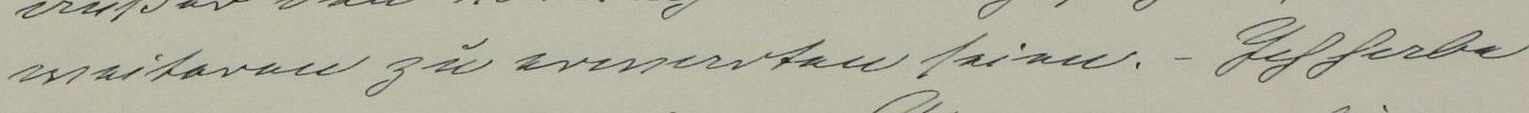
weiteren zu erwarten seien. - Ich habe
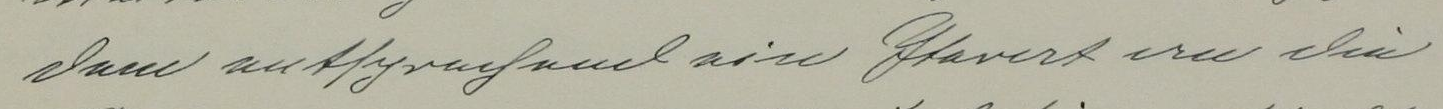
dem entsprechend ein Iterat an die
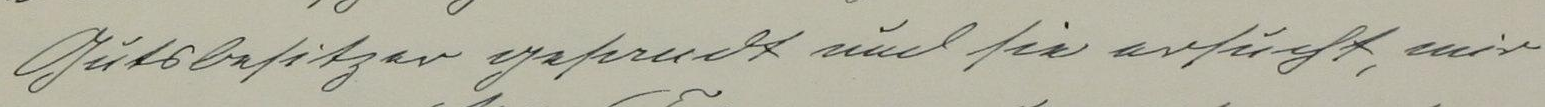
Gutsbesitzer gesandt und sie ersucht, mir
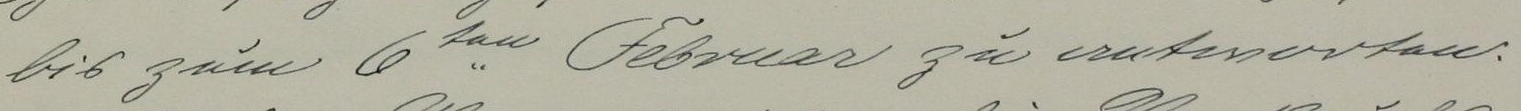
bis zum 6ten Februar zu antworten.
